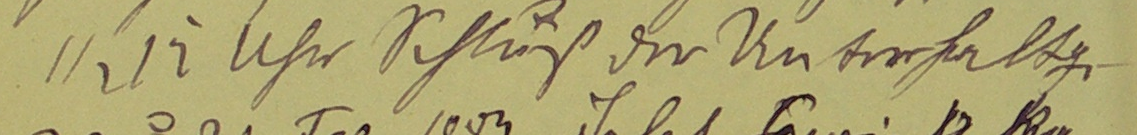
½ 12 Uhr Schluß der Unterhaltung.
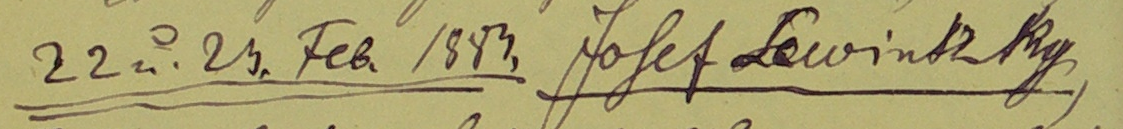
22 und 23. Februar 1883. Josef Lewinsky
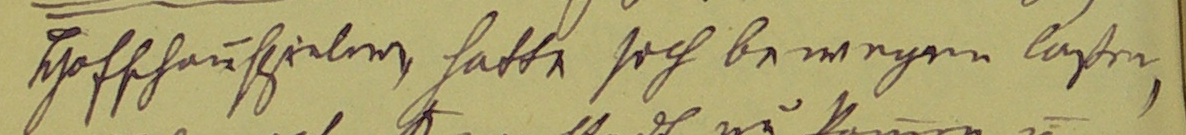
Hofschauspielerhatte sich bewegen laßen
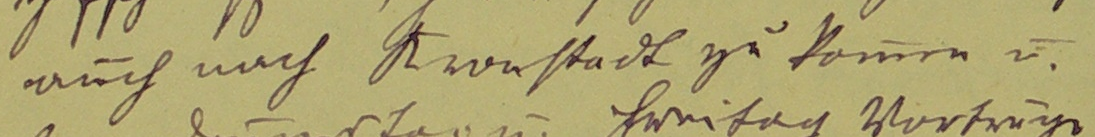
auch nach Kronstadt zu kommen und
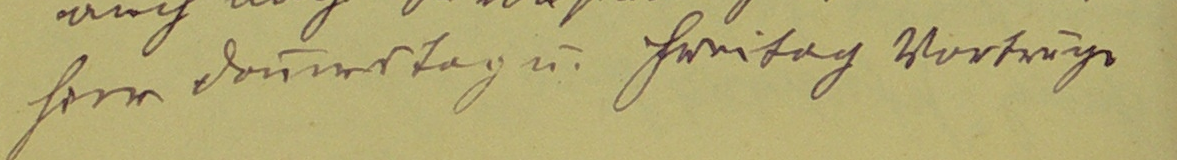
hier Donnerstag und Freitag Voträge
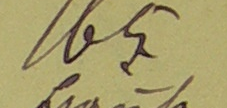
165
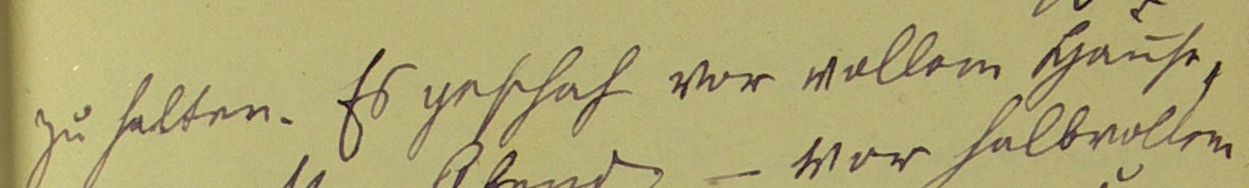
zu halten. Es geschah vor vollem Hause.
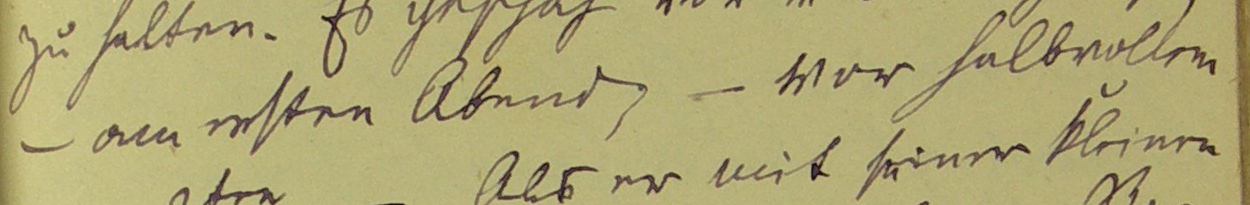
- am ersten Abend- vor halbvollem
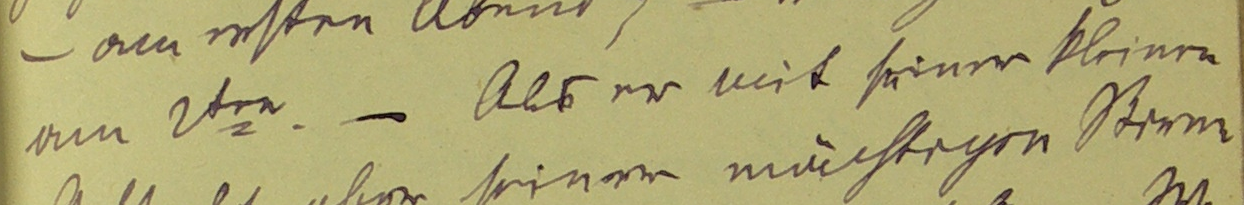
am 2- ten.- Als er mit seiner kleiner
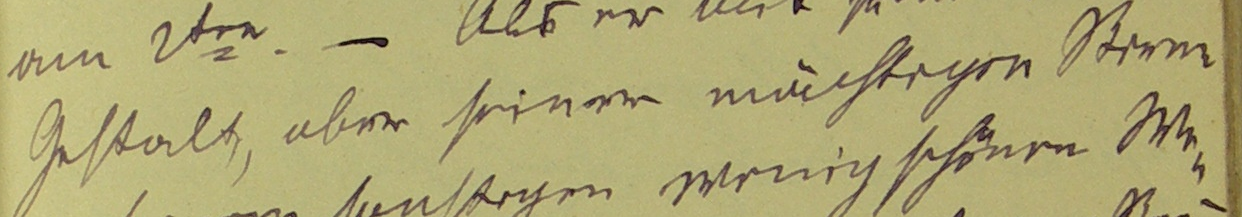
Gestalt, aber seiner mächtigen Stimme
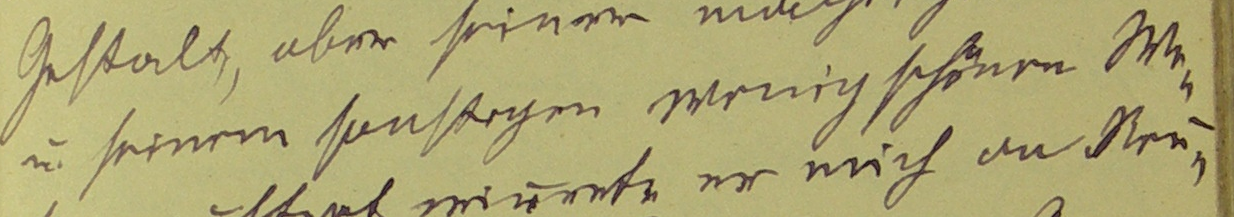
und seinem sonstigen wenig schönem We¬
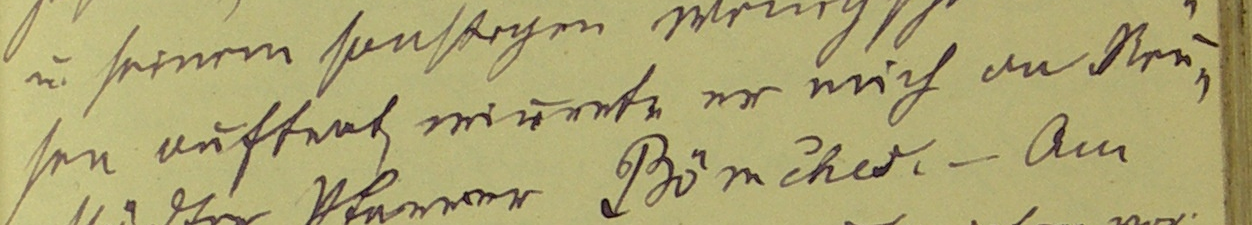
sen auftrat , erinnerte er mich an den Kron¬
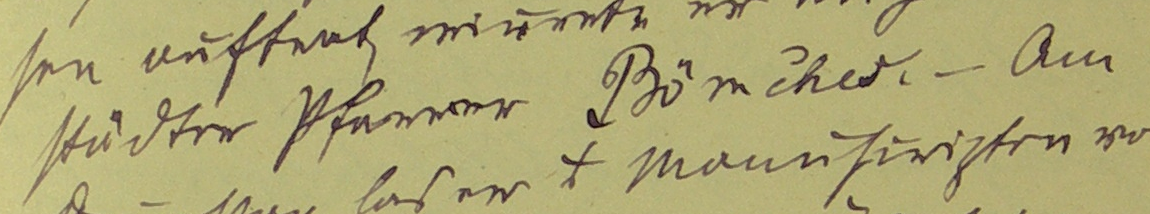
städter Pfarrer Bömches.—Am
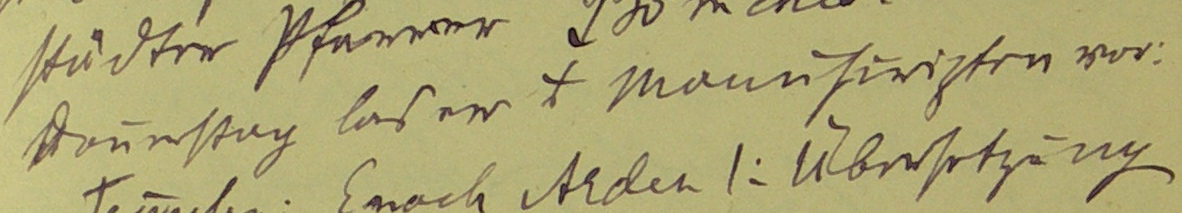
Donnerstag las er aus Manuskripten vor:
